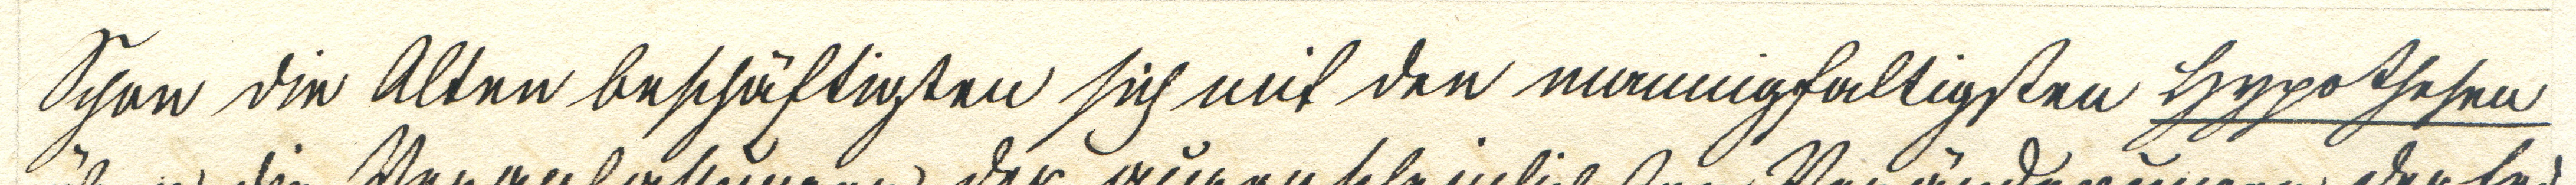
Schon die Alten beschäftigten sich mit den mannigfaltigsten Hypothesen
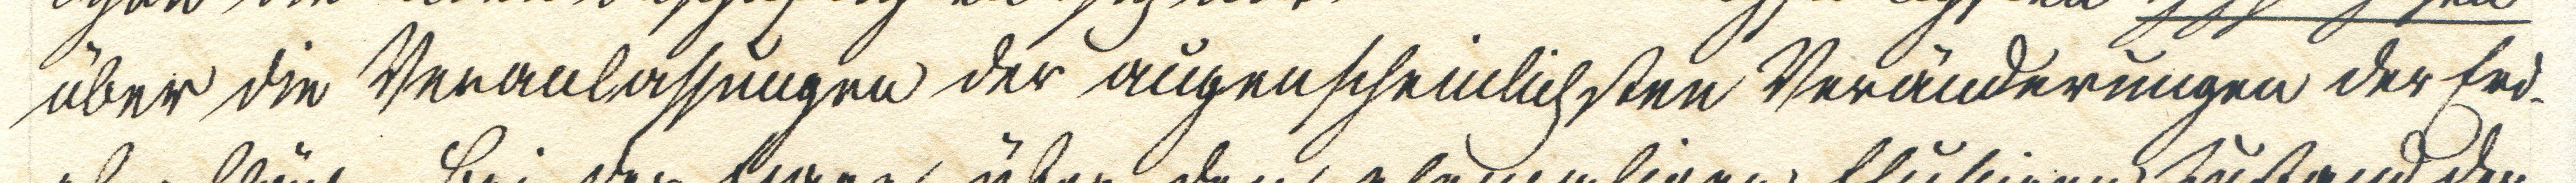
über die Veranlassungen der augenscheinlichsten Veränderungen der Erd-
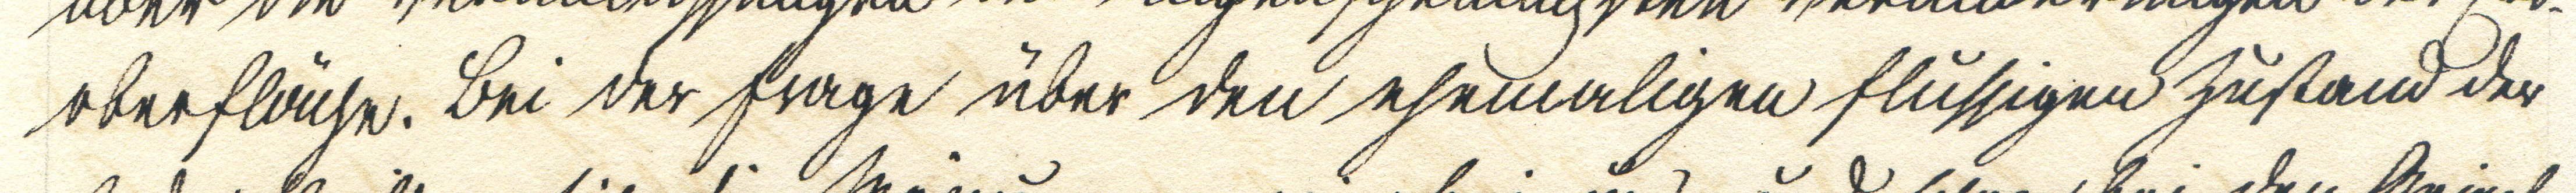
oberfläche. Bei der Frage über den ehemaligen flüssigen Zustand der
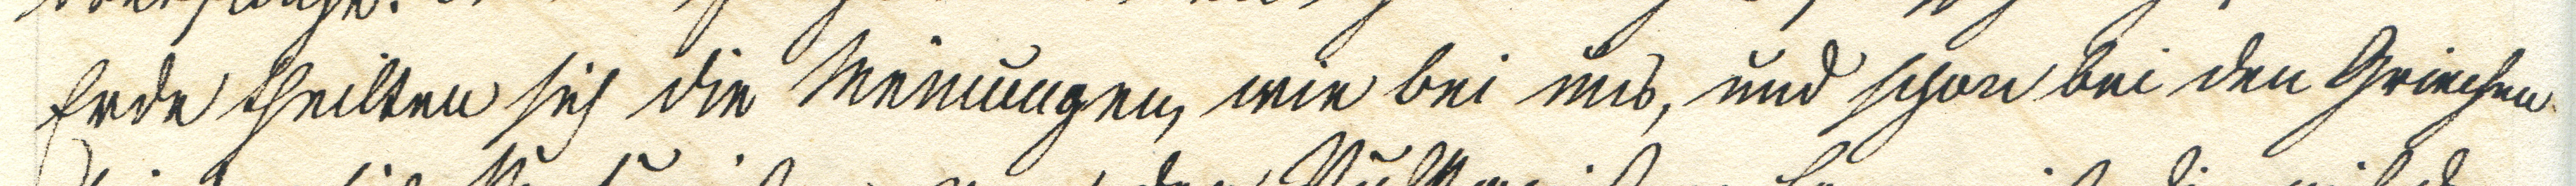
Erde theilten sich die Meinungen, wie bei uns, und schon bei den Griechen
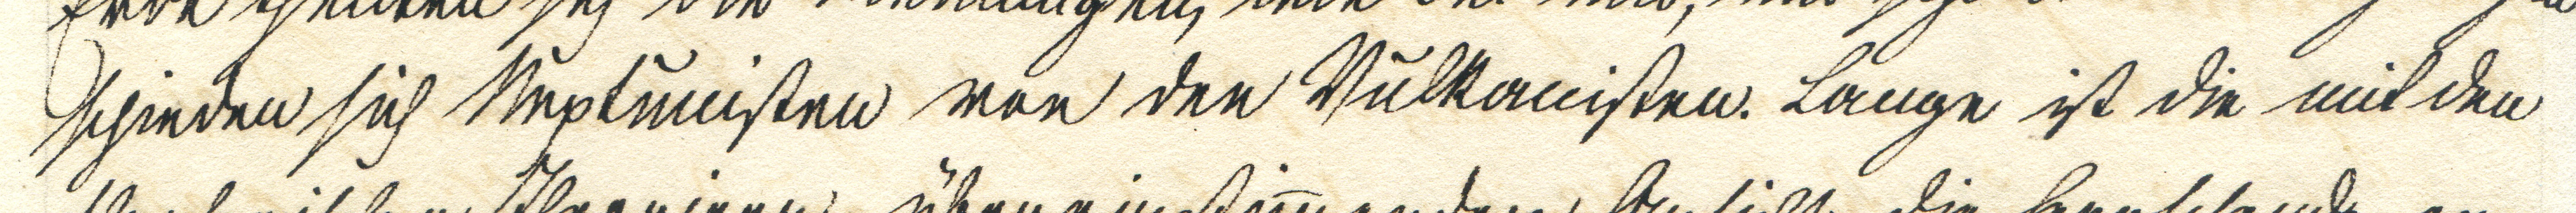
schieden sich Neptunisten von den Vulkanisten. Lange ist die mit den
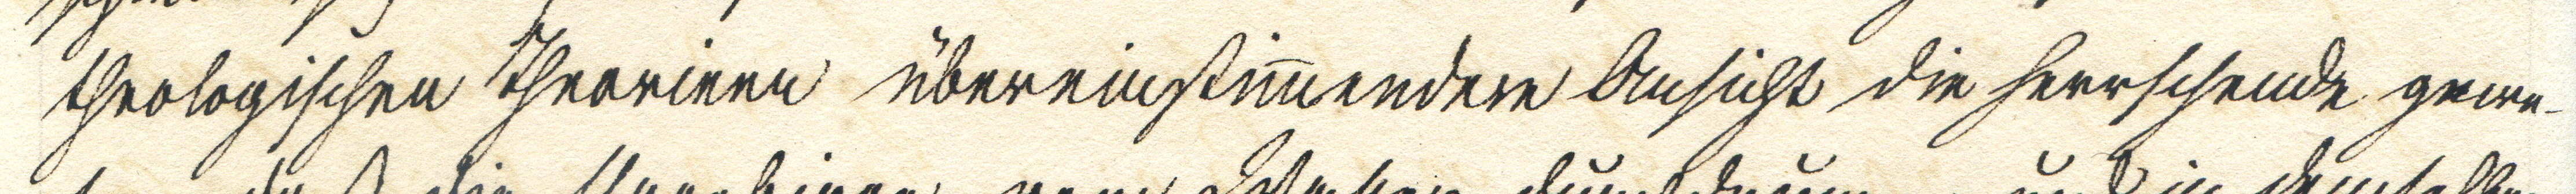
theologischen Theorieen übereinstim̃endere Ansicht die herrschende gewe-
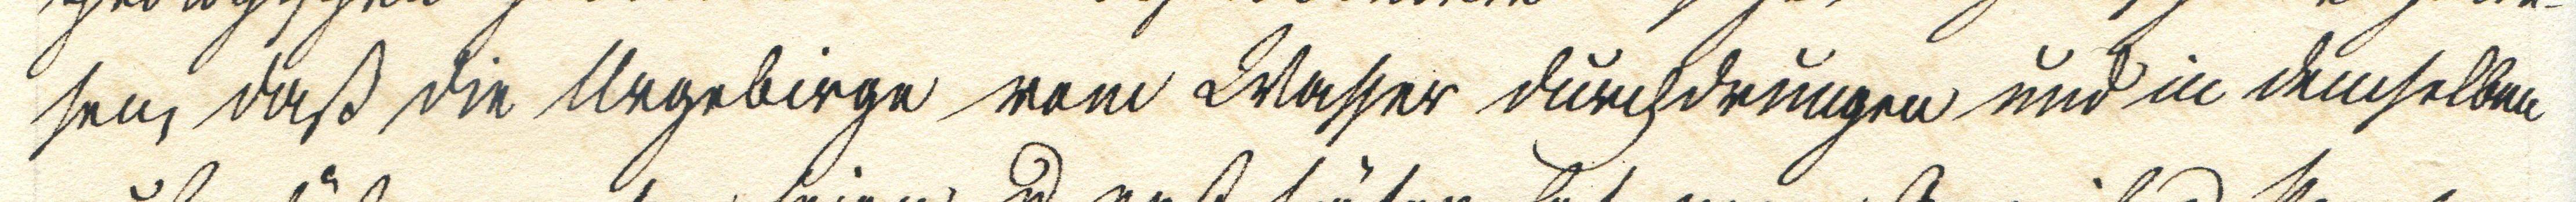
sen, daß die Urgebirge vom Wasser durchdrungen und in demselben
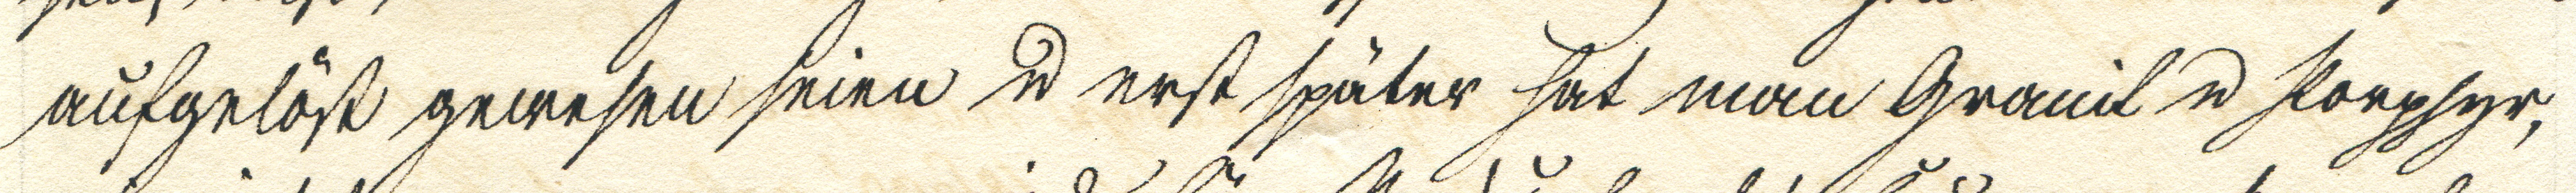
aufgelöst gewesen seien u erst spät hat man Granit u Porphyr,
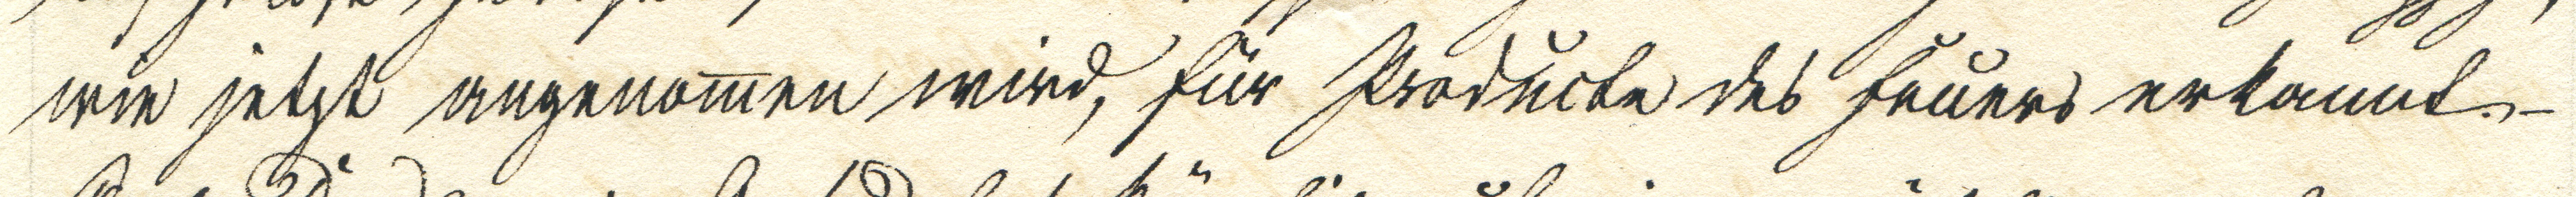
wie jetzt angenom̃en wird, für Producte des Feuers erkannt. –
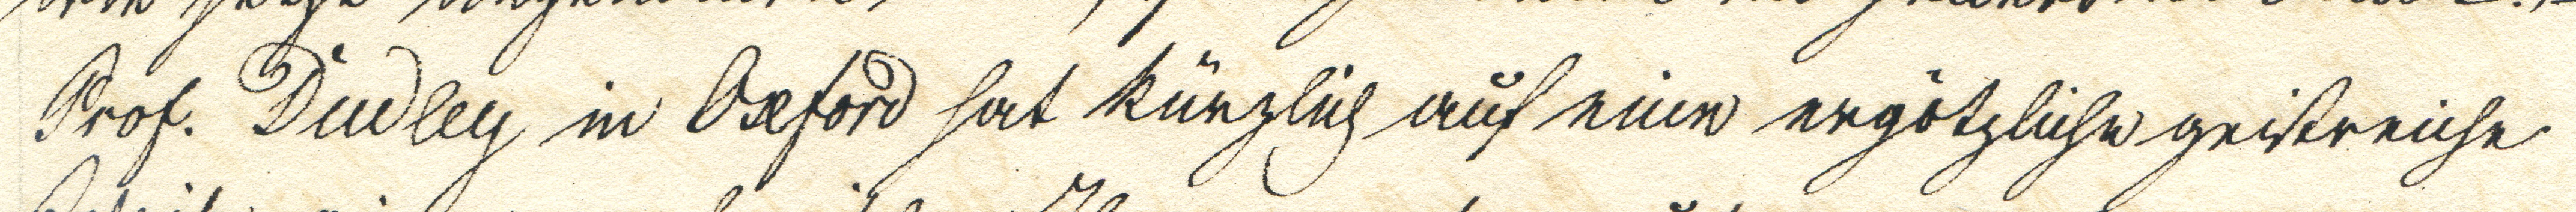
Prof. Dudley in Oxford hat kürzlich auf eine ergötzlich geistreiche
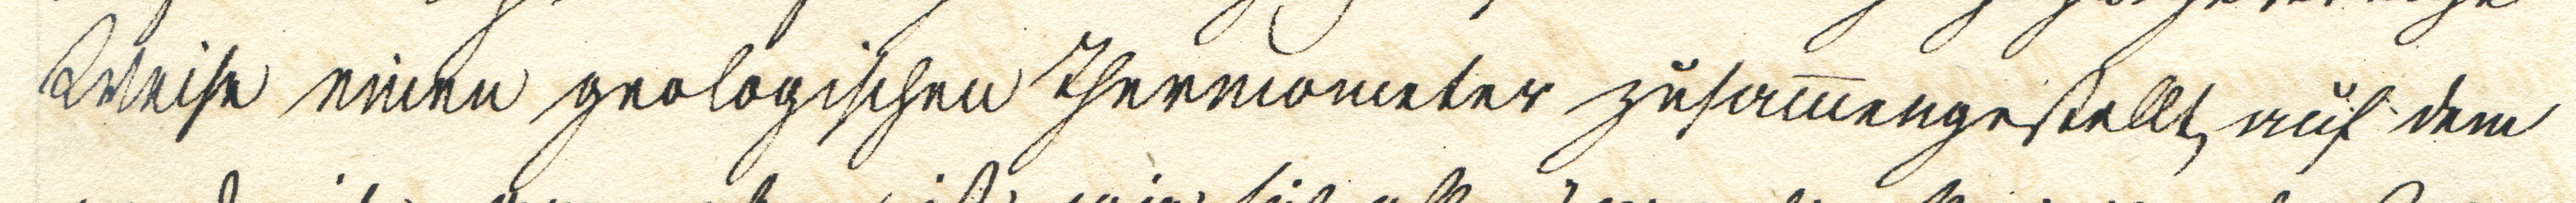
Weise einen geologischen Thermometer zusam̃mengestellt, auf dem
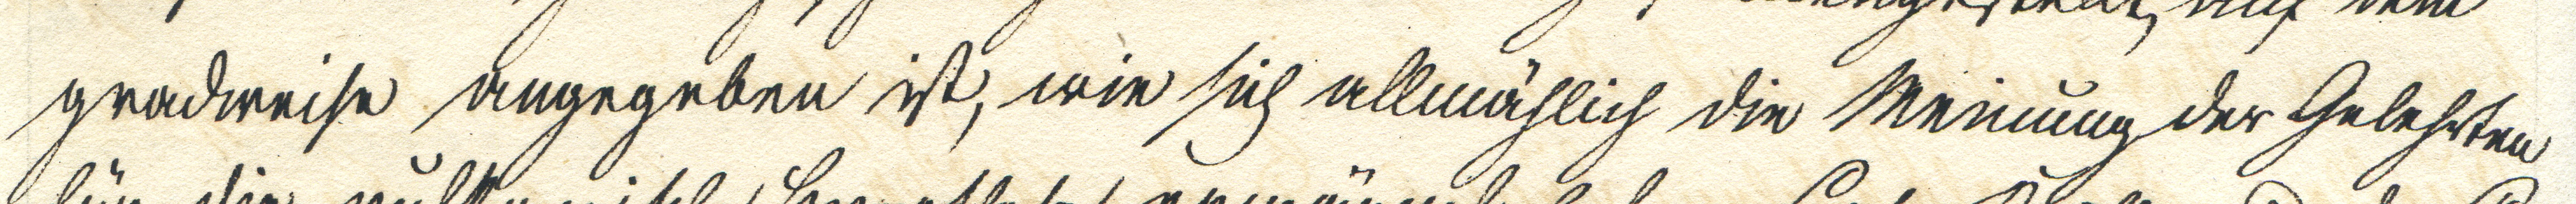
gradweise angegeben ist, wie sich allmählig die Meinung der Gelehrten
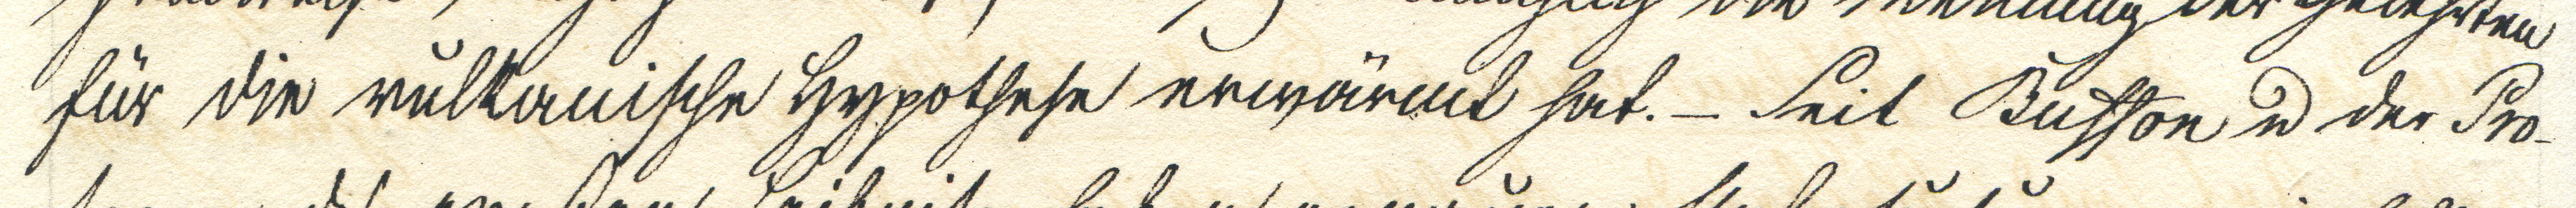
für die vulkanische Hypothese erwärmt hat. – Seit Buffon u der Pro-
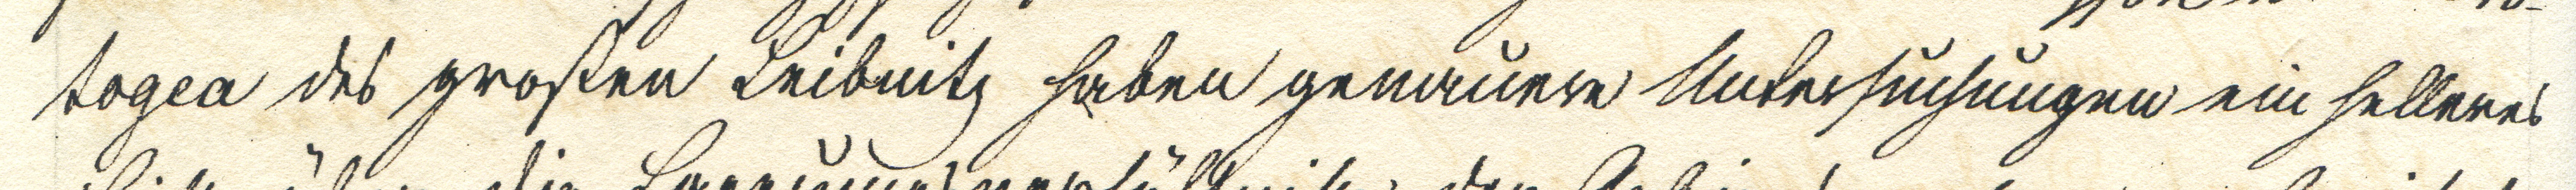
togea des großen Leibnitz haben genauere Untersuchungen ein helleres
